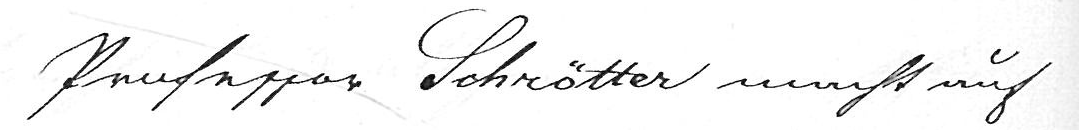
Professor Schrötter macht auf
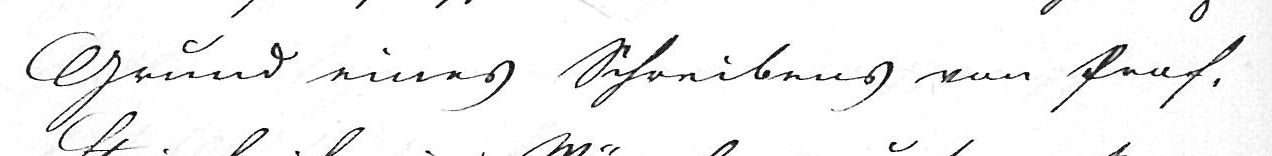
Grund eines Schreibens von Prof.
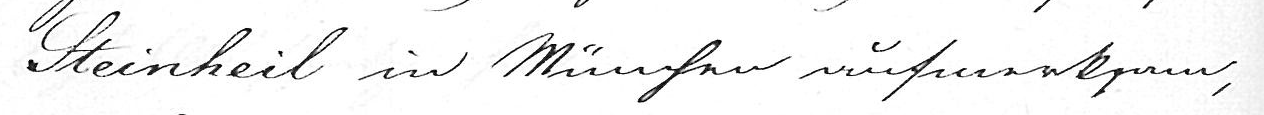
Steinheil in München aufmerksam,
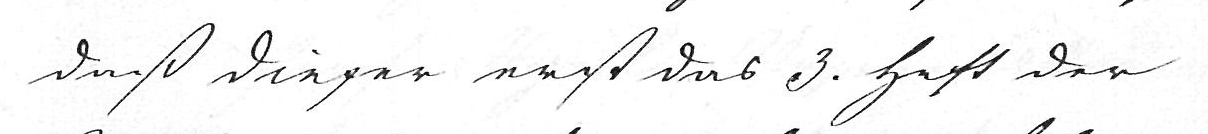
daß dieser erst das 3. Heft der
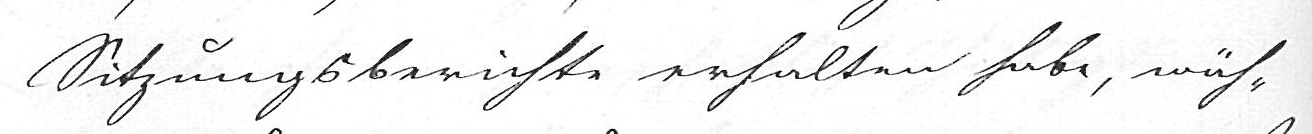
Sitzungsberichte erhalten habe, wäh-
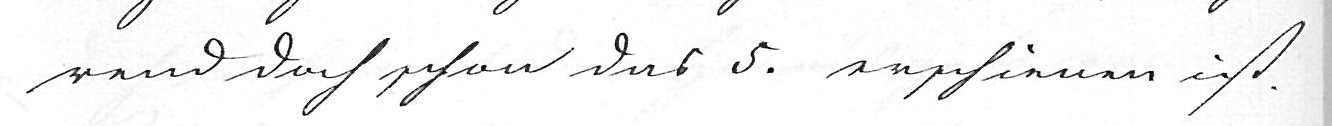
rend doch schon das 5. erschienen ist.
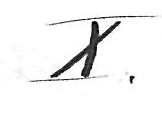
X.
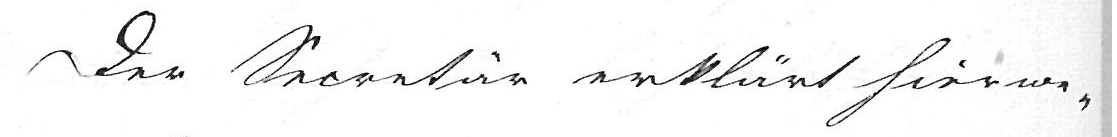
Der Secretär erklärt hierwe-
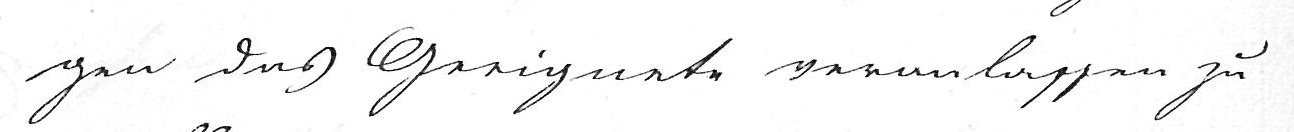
gen das Geeignete veranlassen zu
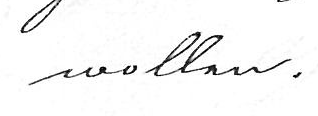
wollen.
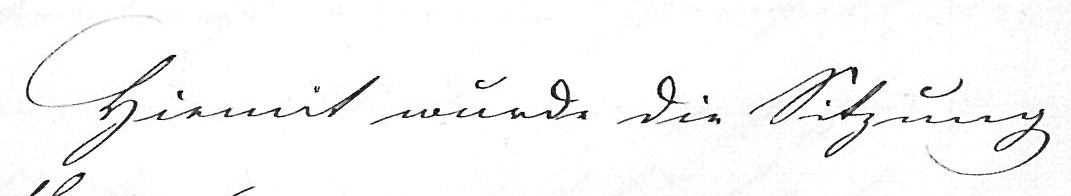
Hiemit wurde die Sitzung
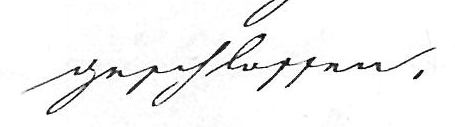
geschlossen.
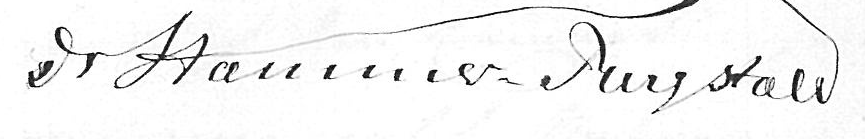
DrHammer-Purgstall
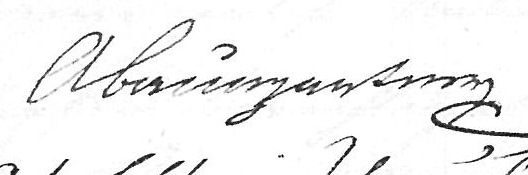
ABaumgartner
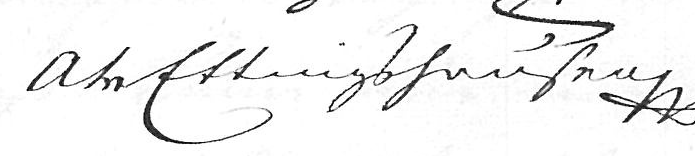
AvEttingshausen
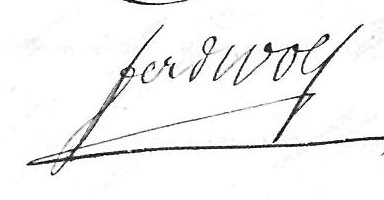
FerdWolf
